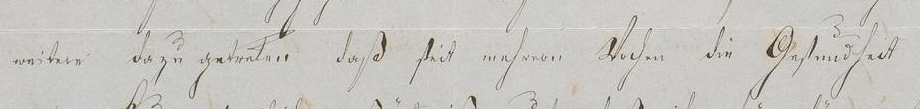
weitern dazu getreten daß seit mehrern Wochen die Gesundheit
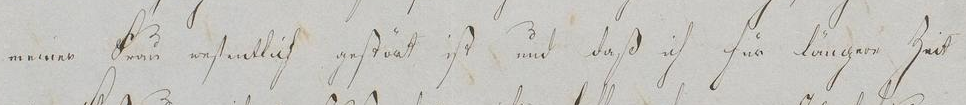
meiner Frau wesentlich gestört ist und daß ich für längere Zeit
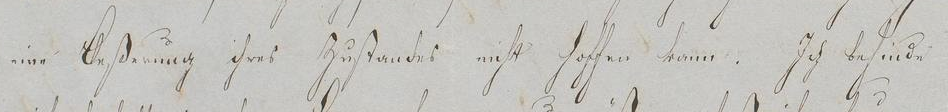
eine Beßerung ihres Zustandes nicht hoffen kann. Ich befinde
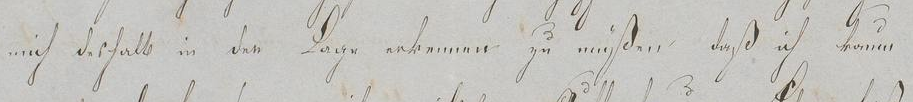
mich deshalb in der Lage erkennen zu müßen, daß ich kaum
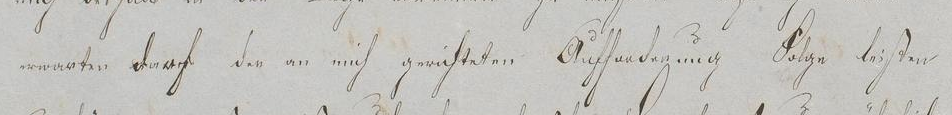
erwarten darf der an mich gerichteten Aufforderung Folge leisten
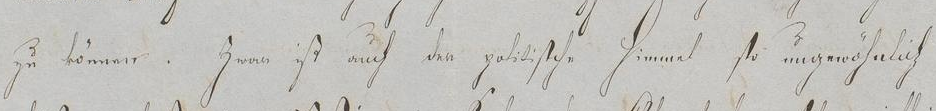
zu können. Zwar ist auch der politische Himmel so ungewöhnlich
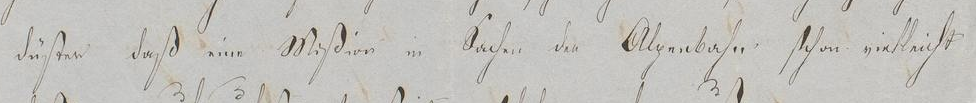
düster daß eine Mißion in Sachen der Alpenbahn schon vielleicht
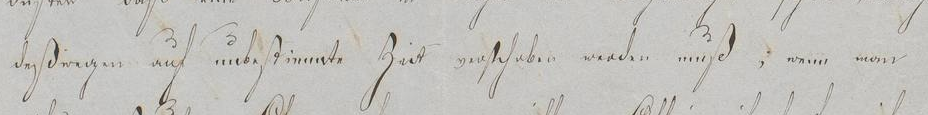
deßwegen auf unbestimmte Zeit verschoben werden muß; wenn man
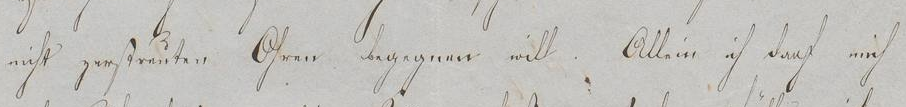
nicht zerstreuten Ohren begegnen will. Allein ich darf mich
